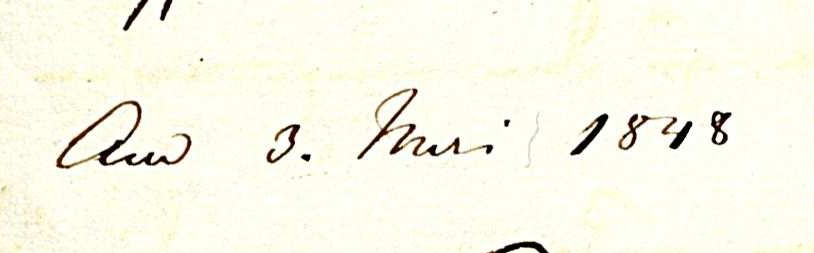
Am. 3. Mai 1848
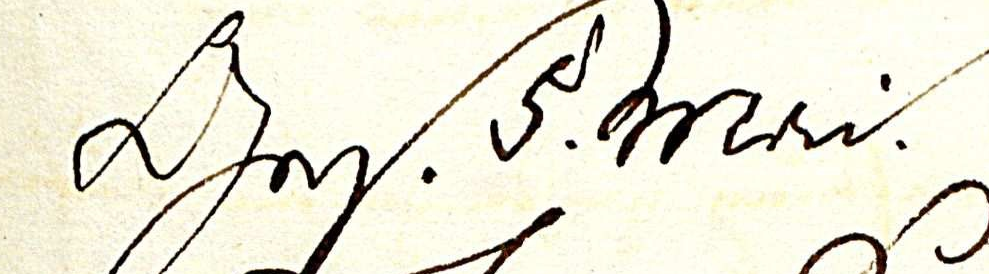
Ges. 5 Mai
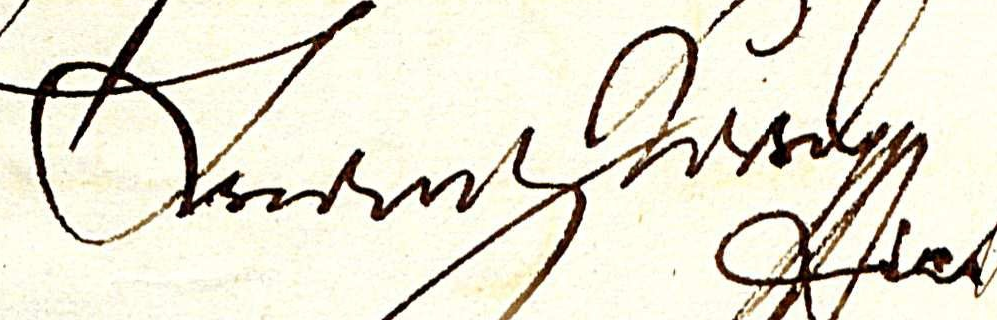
Franz Karl
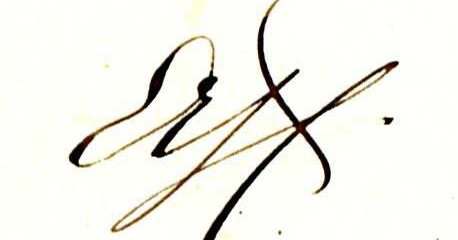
AhE
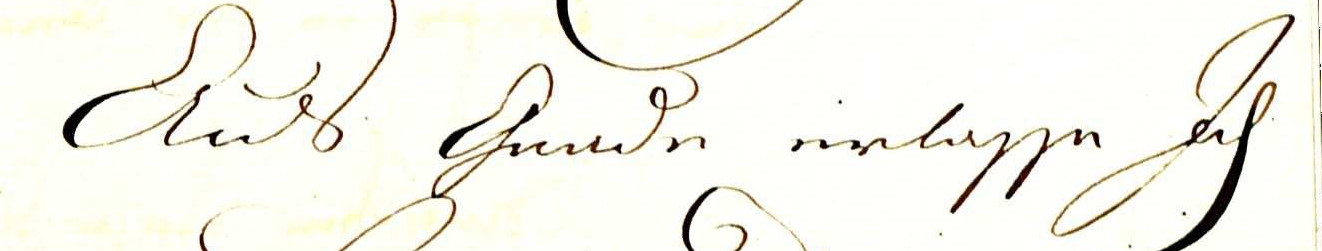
Aus Gnade erlasse Ich
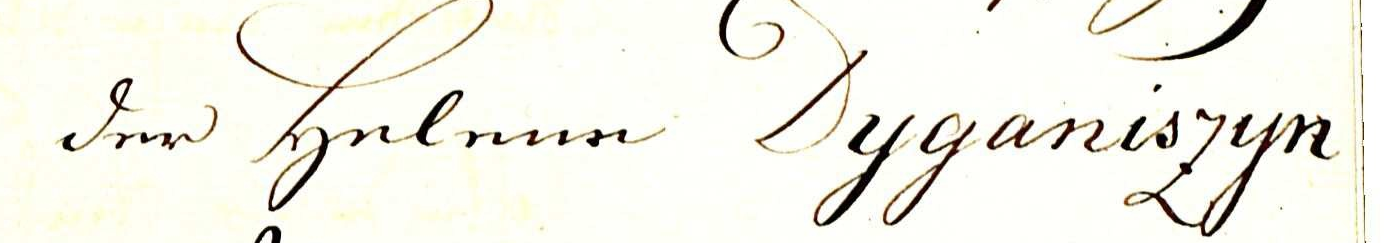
der Helena Dyganiszyn
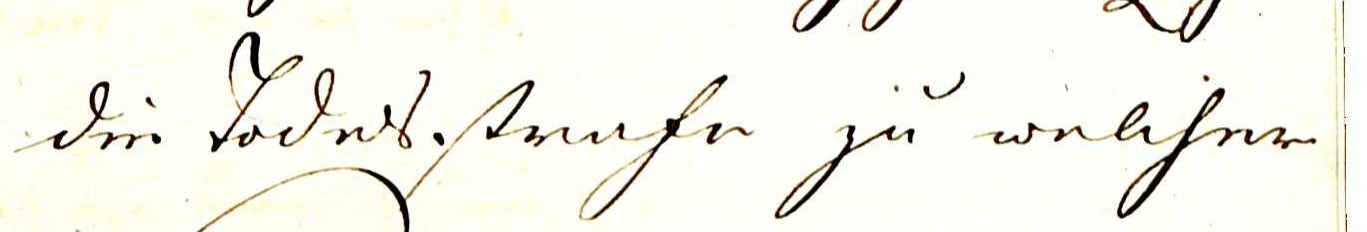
die Todesstrafe zu welchem
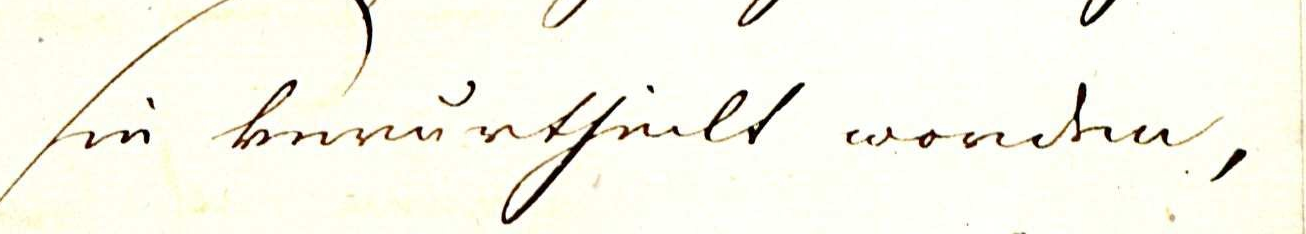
sie verurtheilt worden,
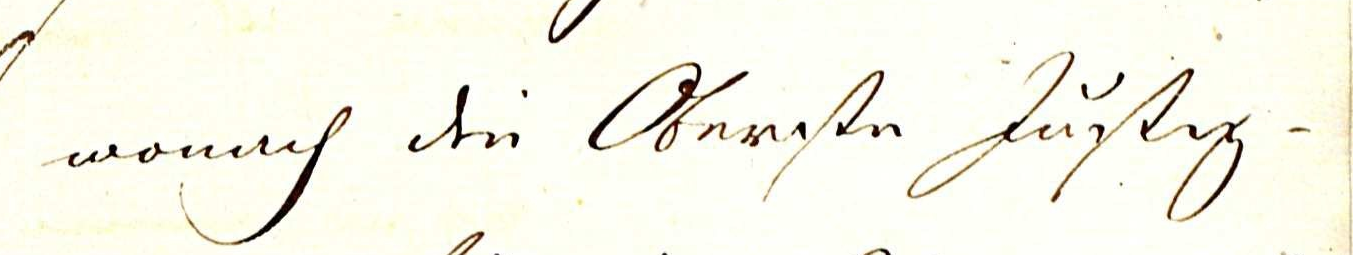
wonach die Oberste Justiz¬
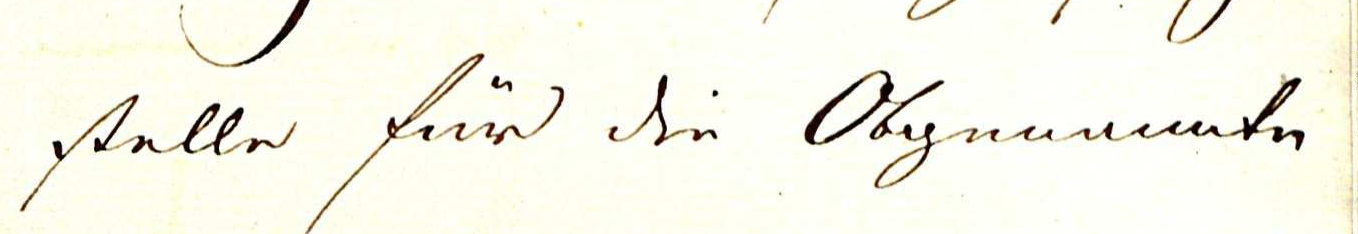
stelle für die Obgenannte
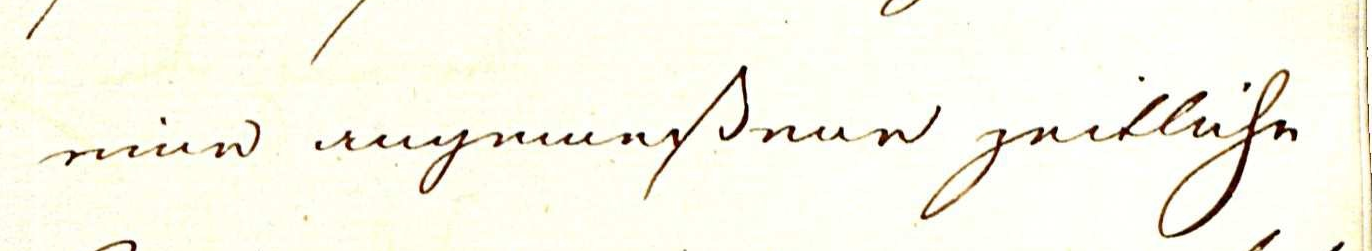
eine angemeßene zeitliche
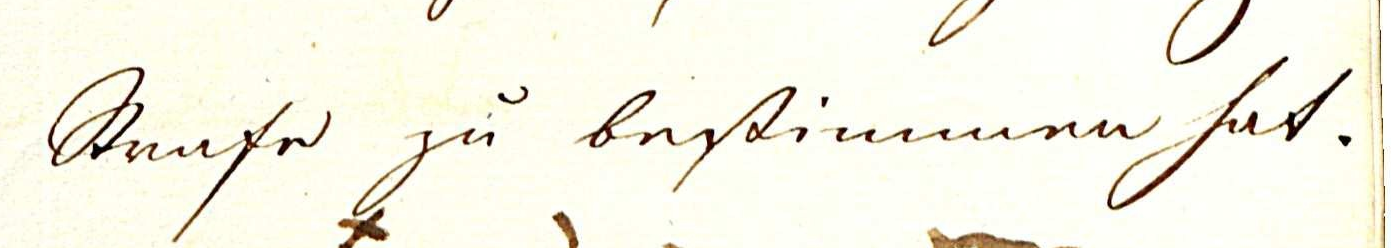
Strafe zu bestimmend hat.
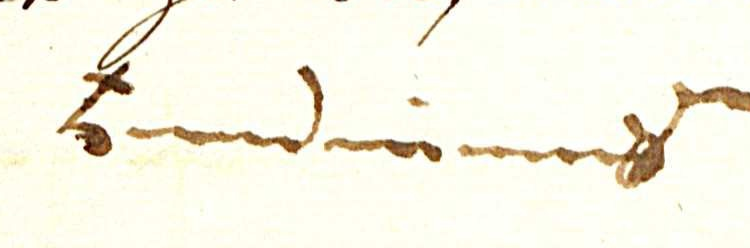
Ferdinand [sign.]
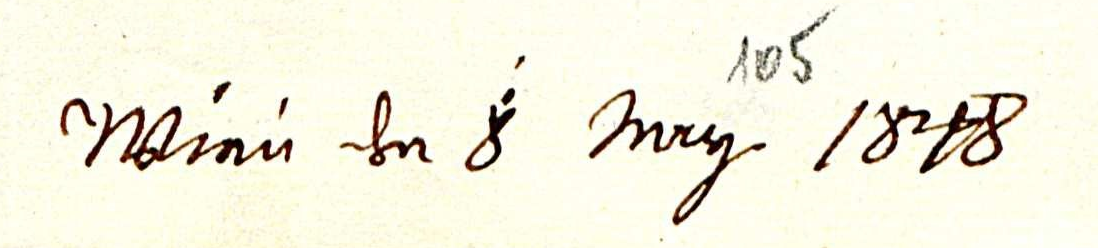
Wien den 8 May 1848
